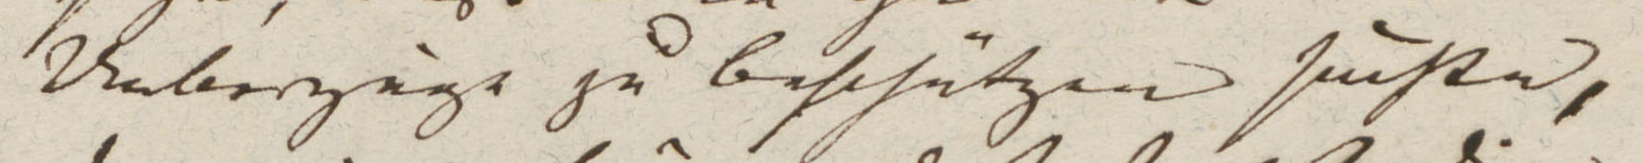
Ueberzuge zu beschützen suchte,
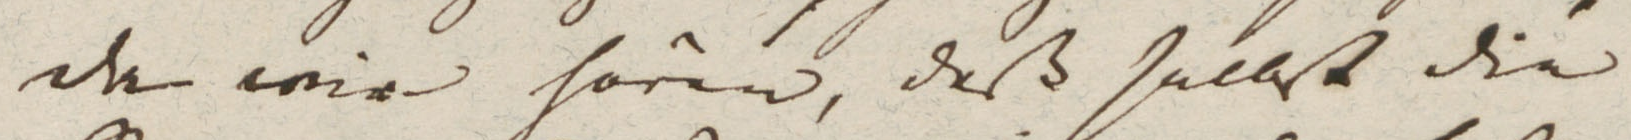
da wir hören, dass selbst die
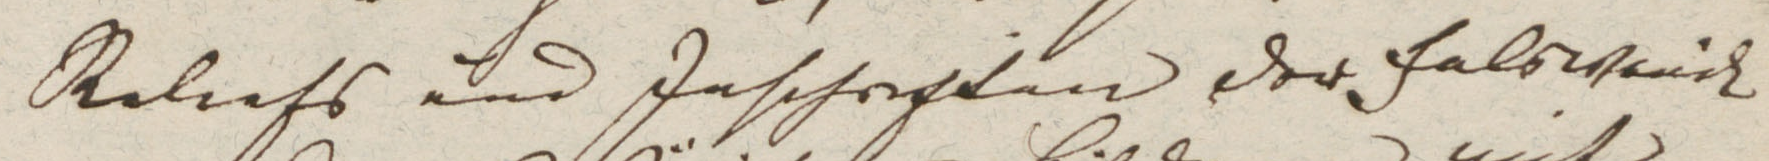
Reliefs und Inschriften der Felswände
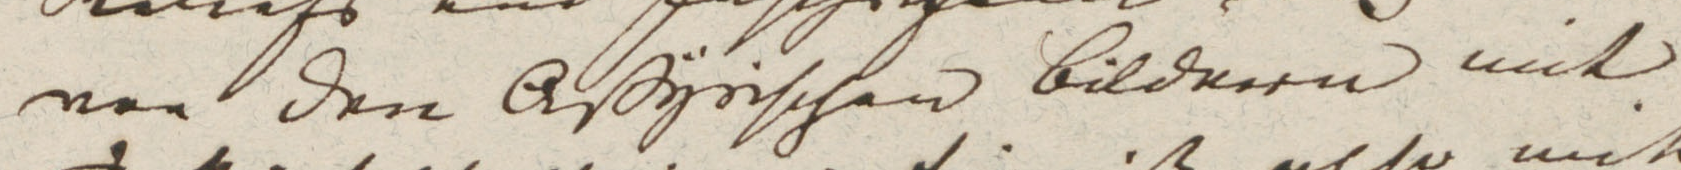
von den Assyrischen Bildern mit
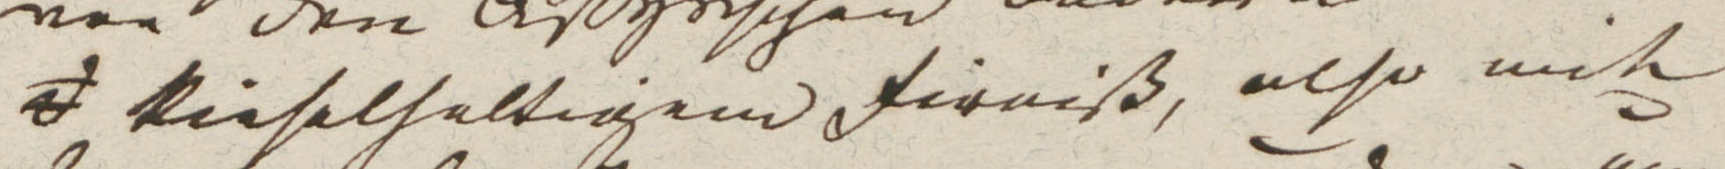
d kieselhaltigem Firniss, also mit
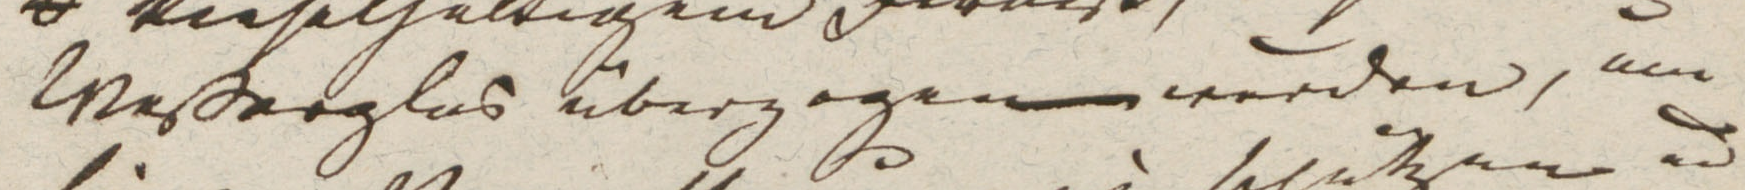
Wasserglas überzogen wurden, um
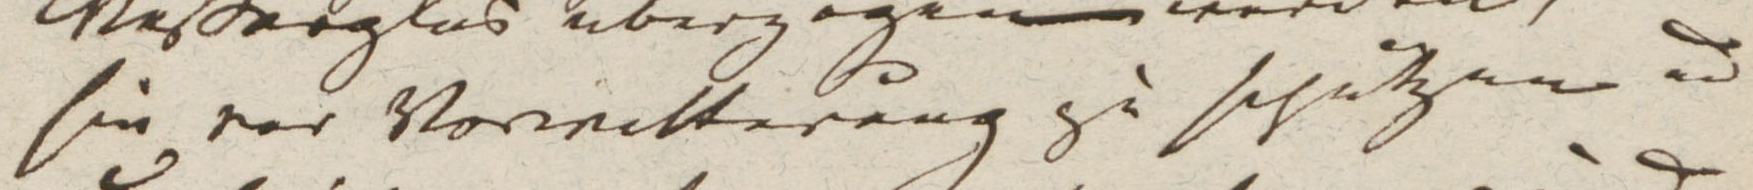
sie vor Verwitterung zu schützen und
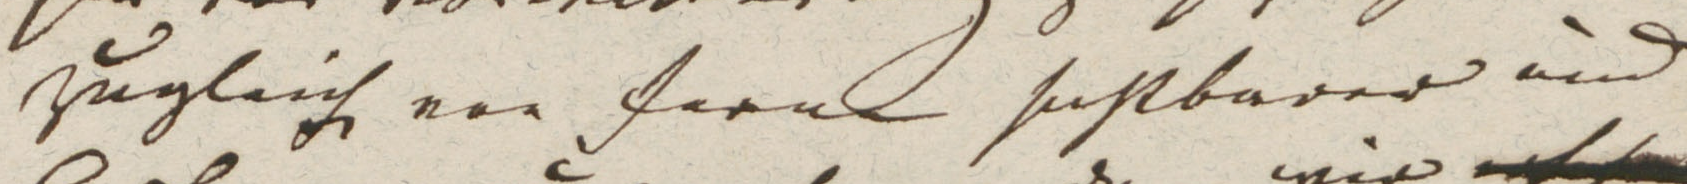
zugleich von Ferne sichtbar und
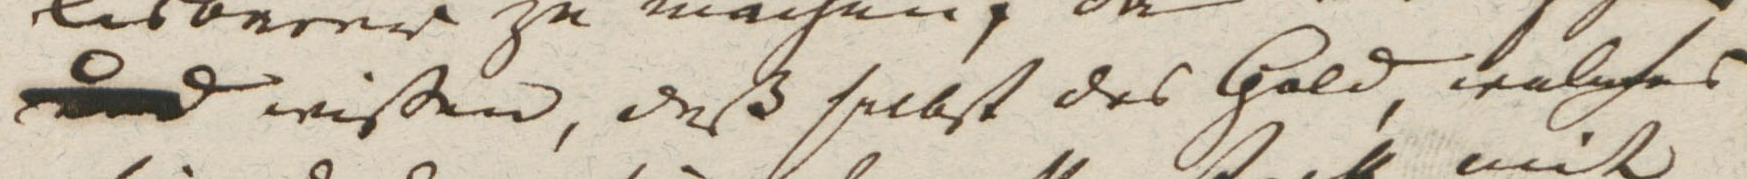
und wissen, dass selbst das Gold, welches
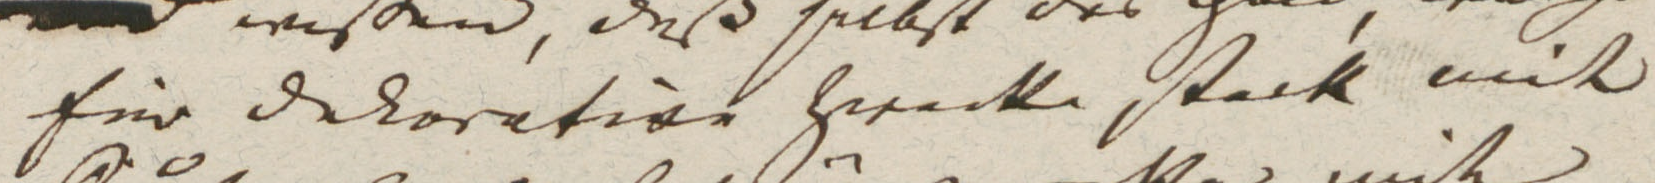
für dekorative Zwecke stark mit
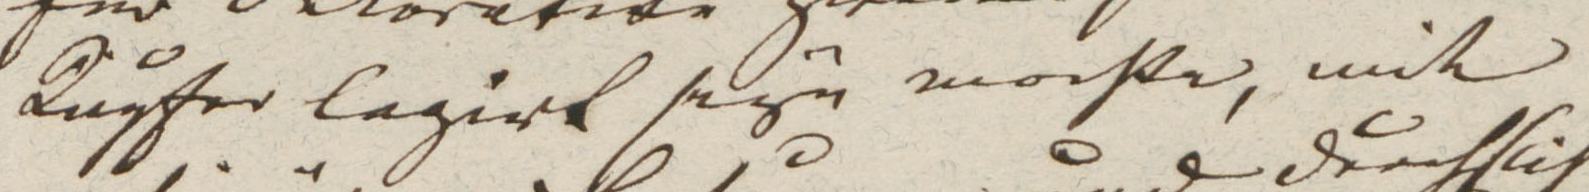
Kupfer legirt seyn mochte, mit
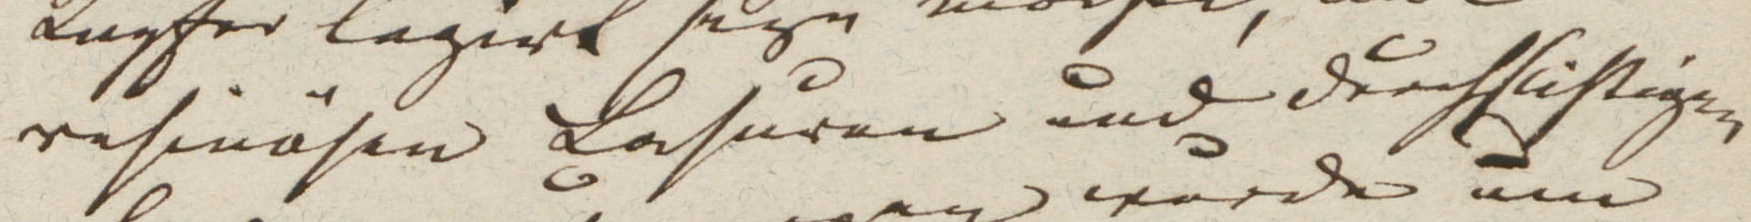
resinösen Lasuren und durchsichtigen
